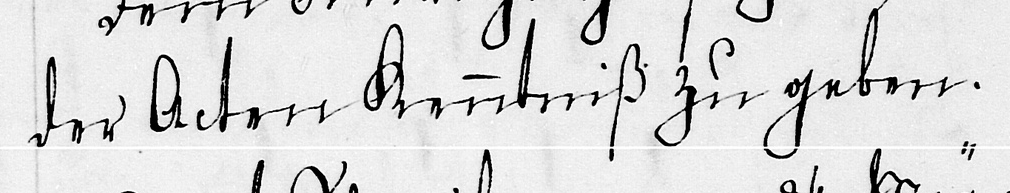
der Acten Kenntniß zu geben.
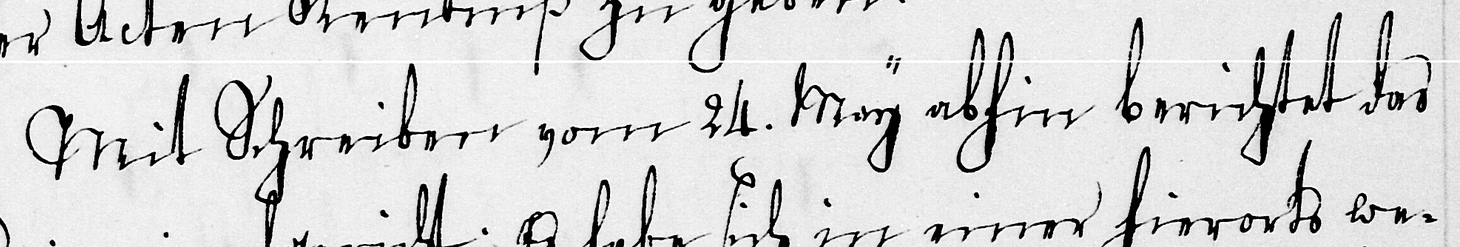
Mit Schreiben vom 24. May abhin berichtet das
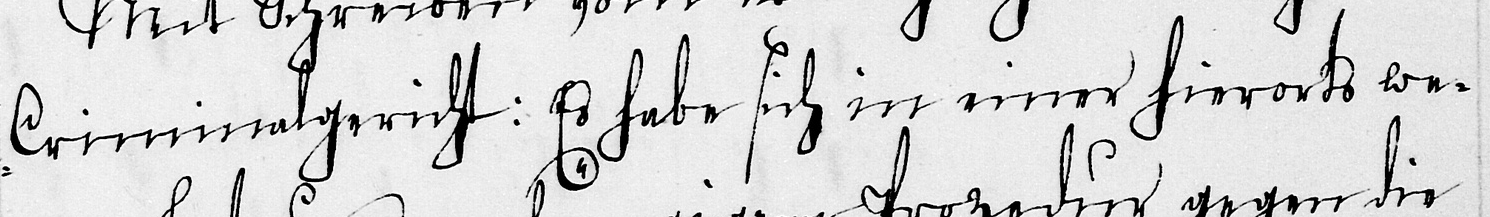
Criminalgericht: Es habe sich in einer hierorts we¬
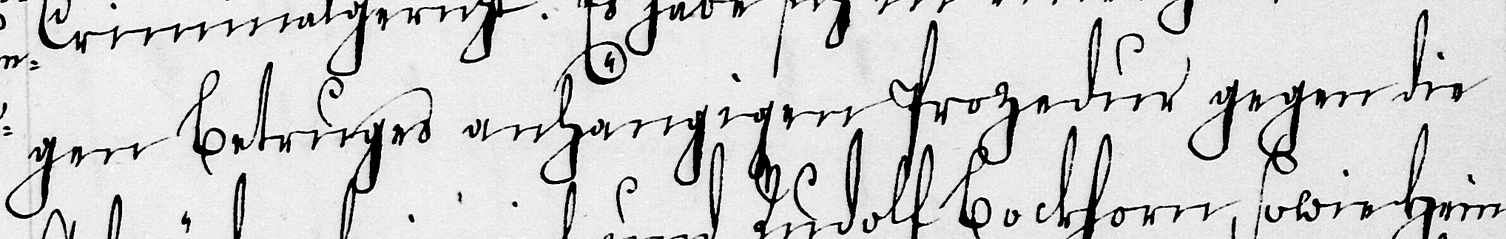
gen Betruges anhängigen Prozedur gegen die
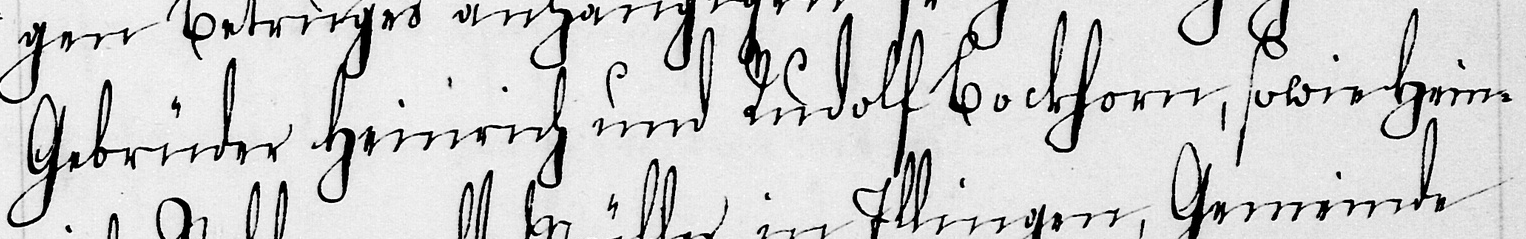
Gebrüder Heinrich und Rudolf Bockhorn, sowie Hein¬
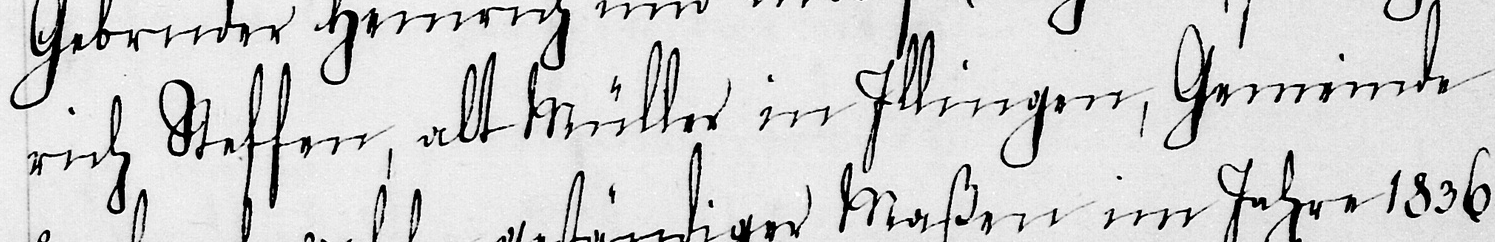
rich Steffen, alt Müller in Illingen, Gemeinde
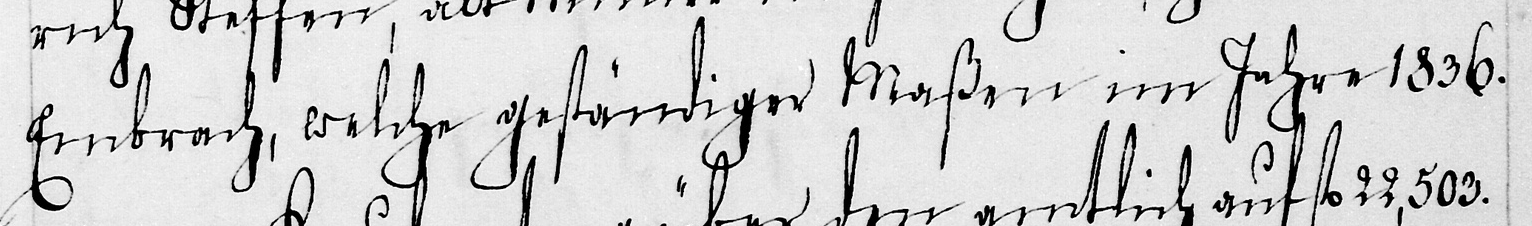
Embrach, welche geständiger Maßen im Jahre 1836.
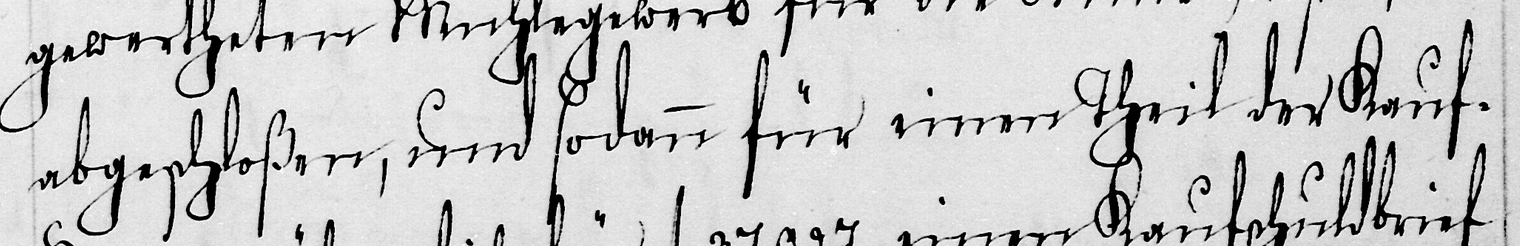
abgeschloßen, und sodann für einen Theil der Kauf¬
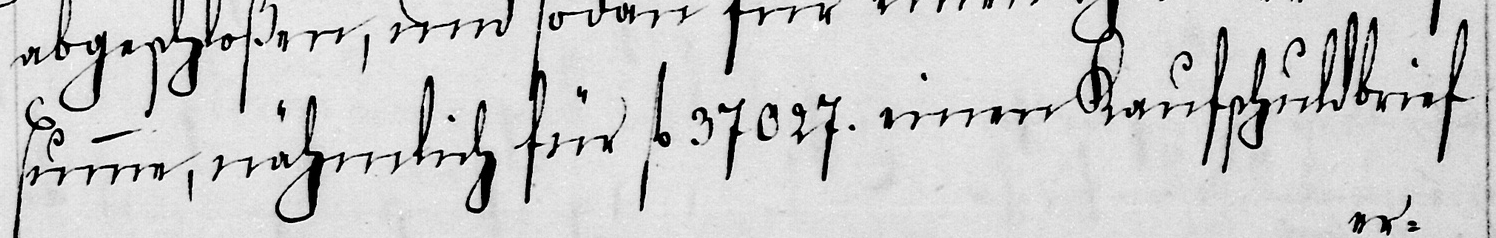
summe, nähmlich für fl. 37 027. einen Kaufschuldbrief
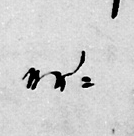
er
